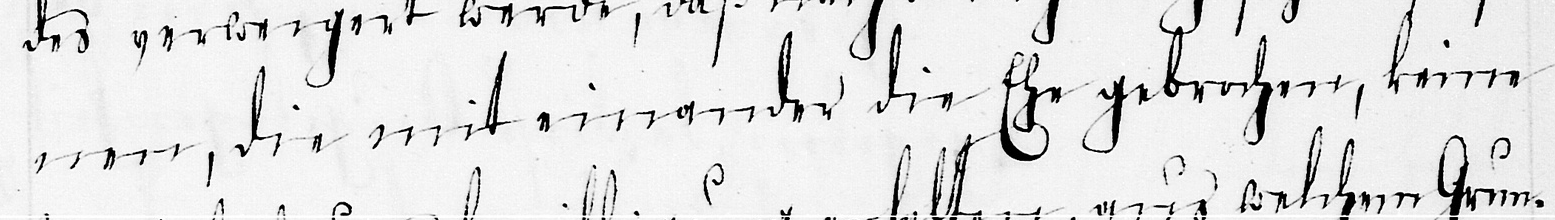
nen, die mit einander die Ehe gebrochen, keine
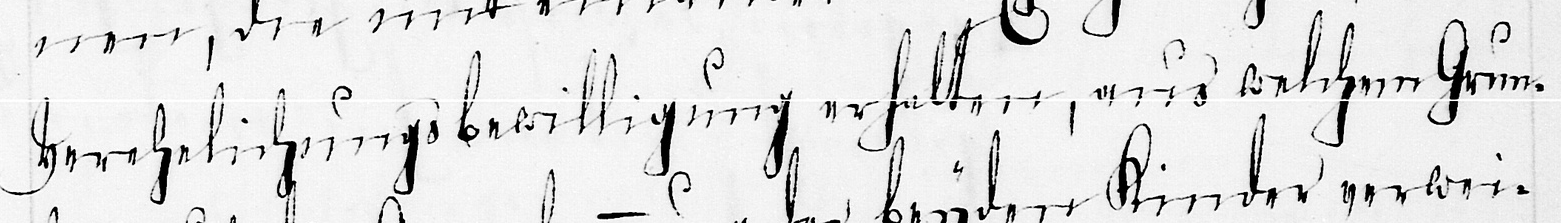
Verehelichungsbewilligung erhalten, aus welchem Grun¬
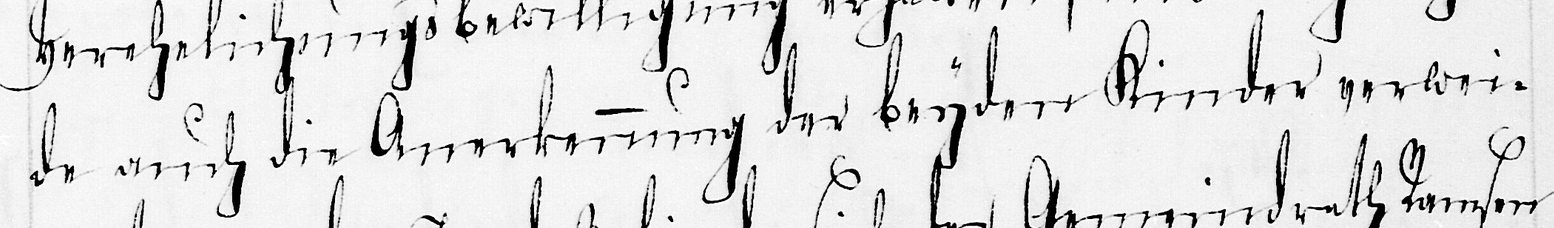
de auch die Anerkennung der beyden Kinder verwei¬
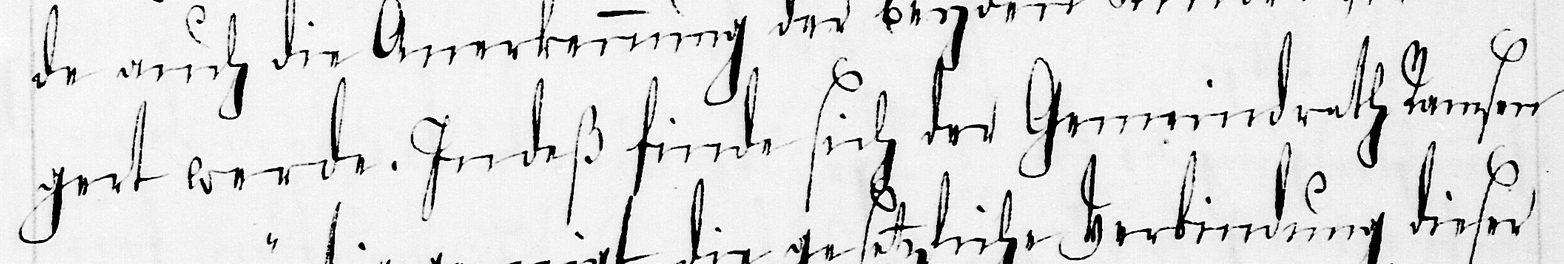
gert werde. Indeß finde sich der Gemeindrath Ramsen
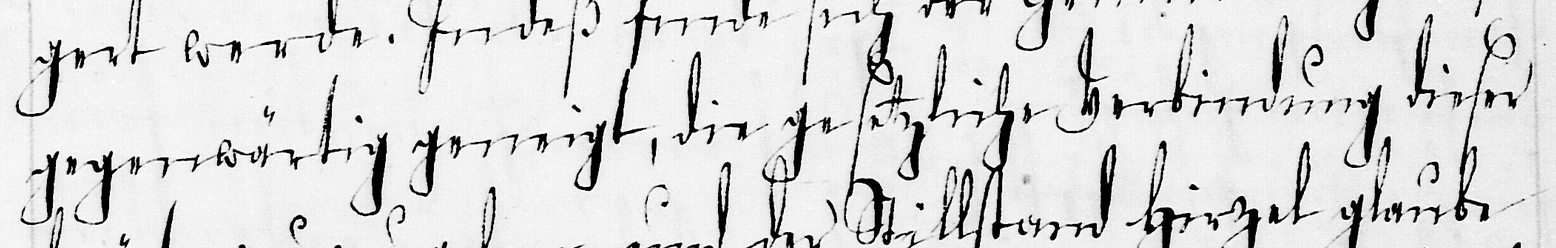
gegenwärtig geneigt, die gesetzliche Verbindung dieser
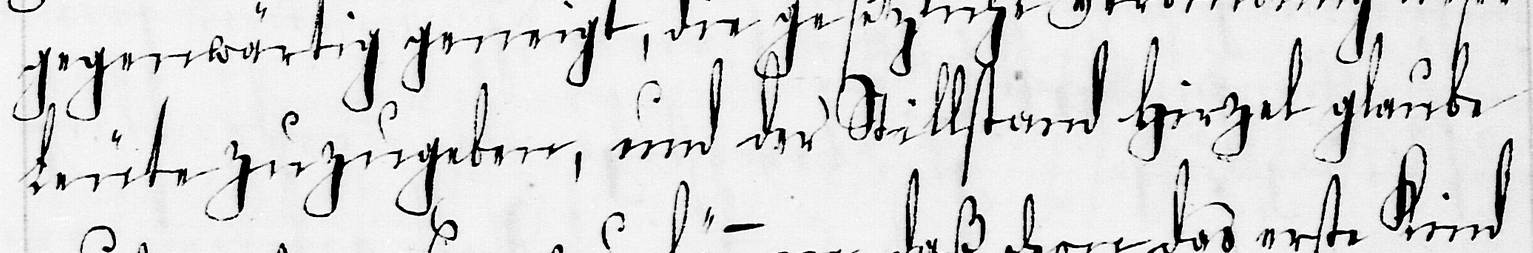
Leute zuzugeben, und der Stillstand Hirzel glaube
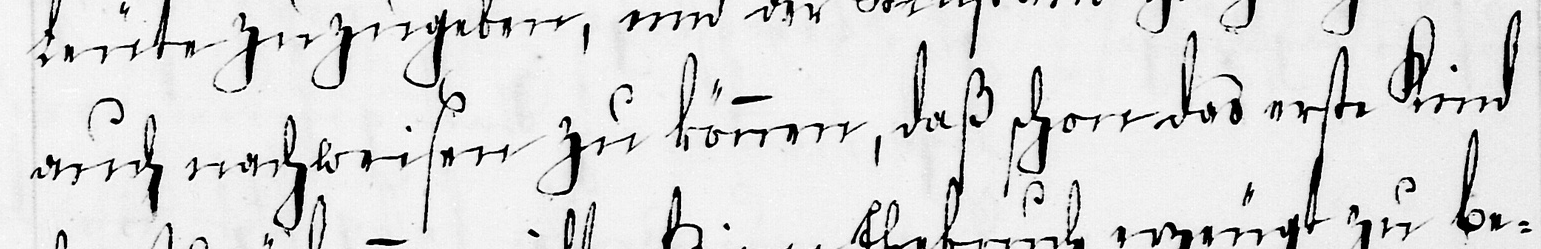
auch nachweisen zu können, daß schon das erste Kind
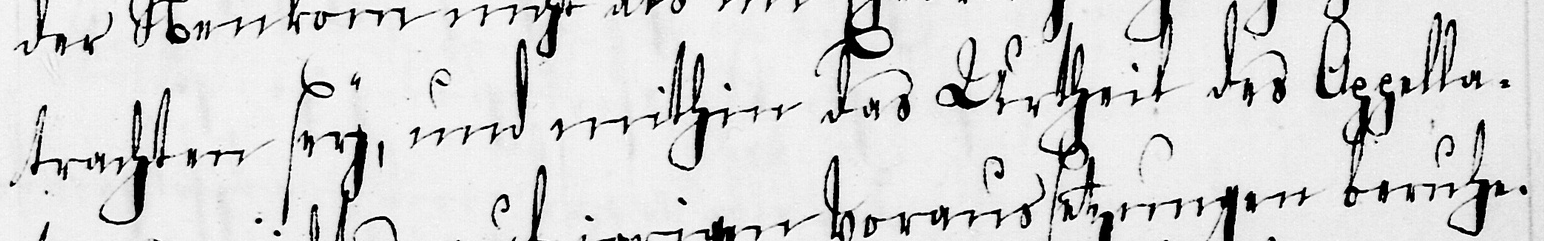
rachten sey, und mithin das Urtheil des Appella¬
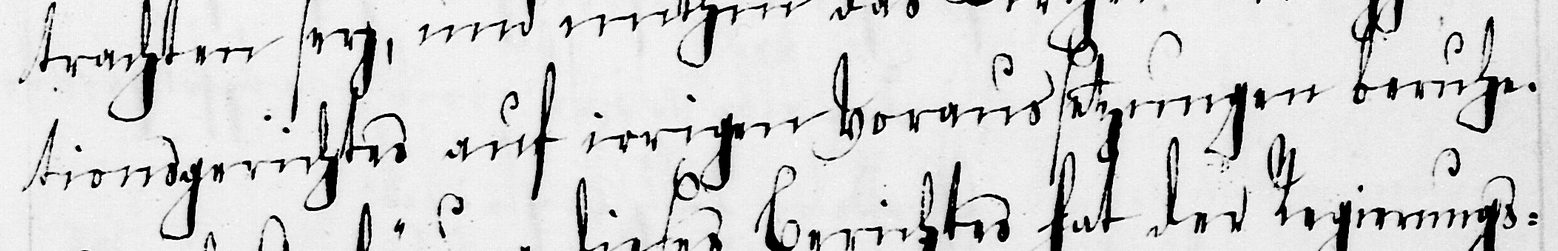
tionsgerichtes auf irrigen Voraussetzungen beruhe.
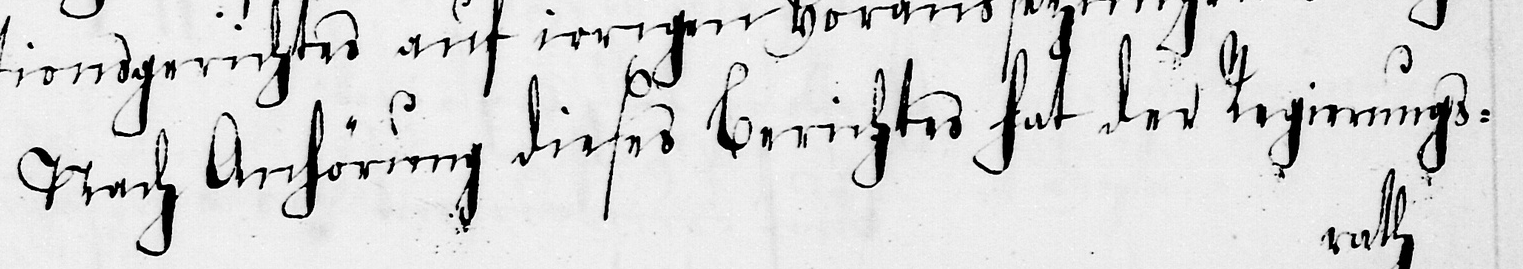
Nach Anhörung dieses Berichtes hat der Regierungs-
